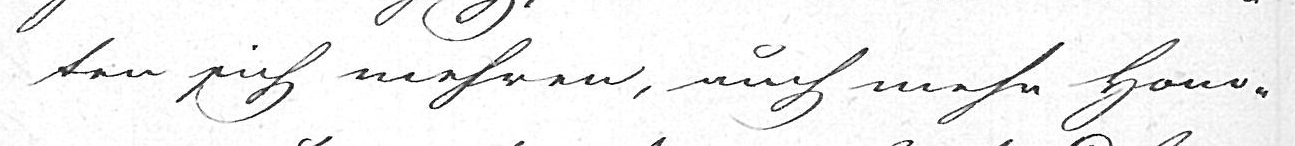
ten sich mehren, auch mehr Hono-
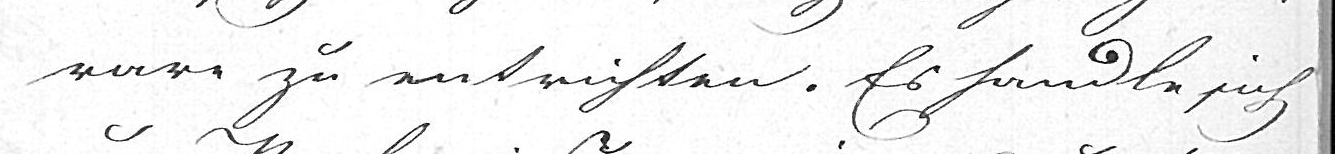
rare zu entrichten. Es handle sich
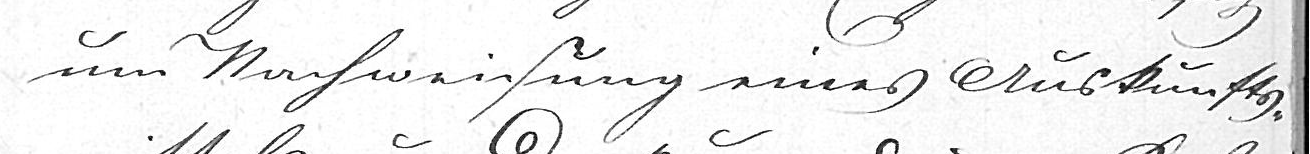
um Nachweisung eines Auskunfts-
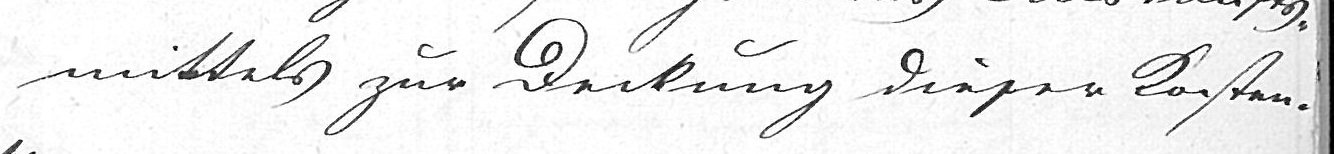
mittels zur Deckung dieser Kosten.
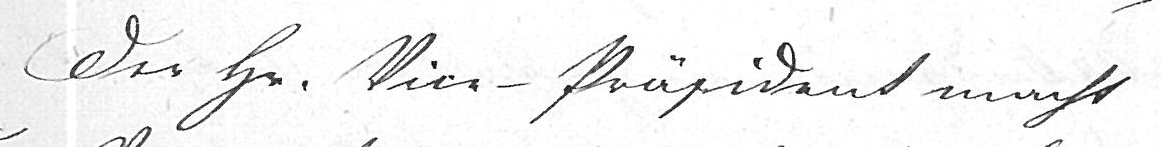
Der Hr. Vice-Präsident macht
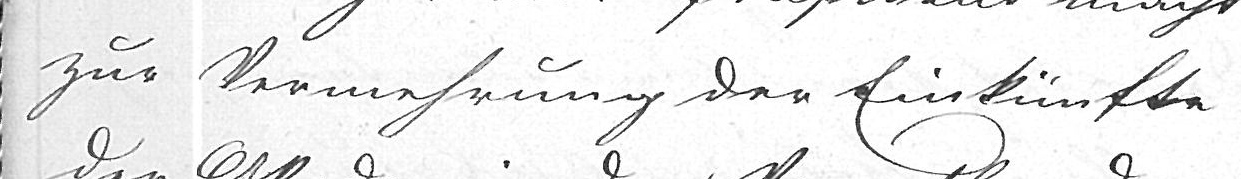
zur Vermehrung der Einkünfte
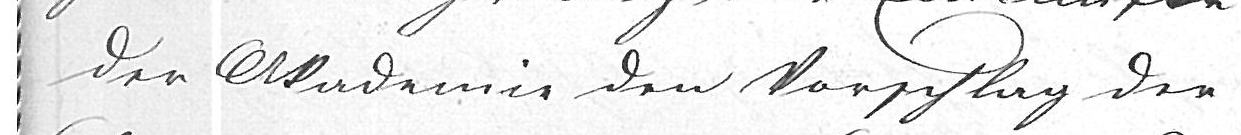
der Akademie den Vorschlag der
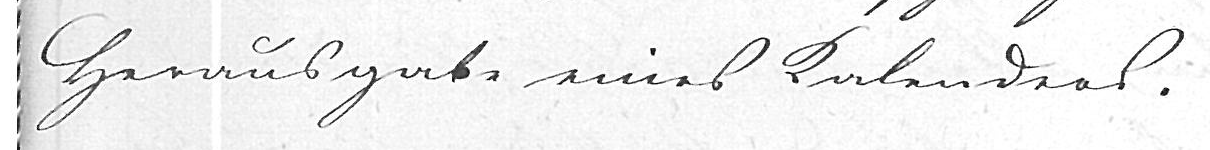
Herausgabe eines Kalenders.
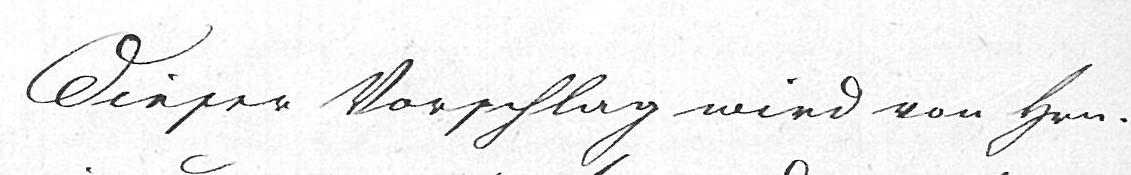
Dieser Vorschlag wird von Hrn.
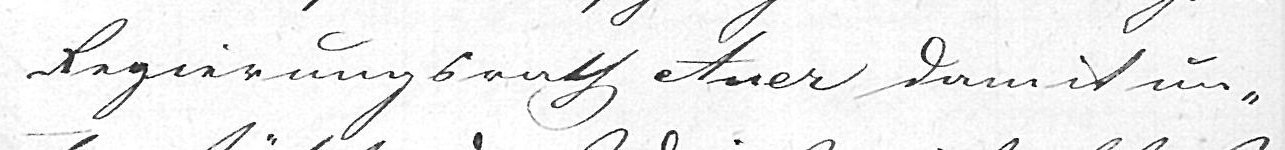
Regierungsrath Auer damit um-
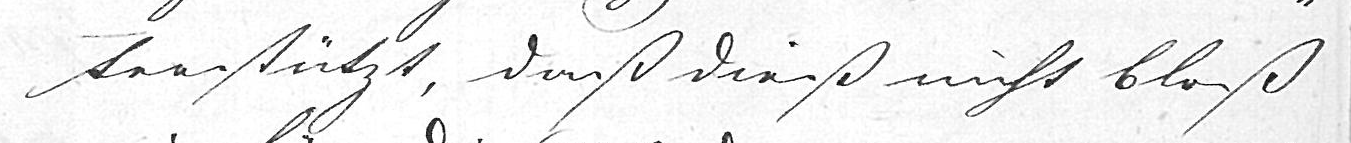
terstützt, daß dieß nicht bloß
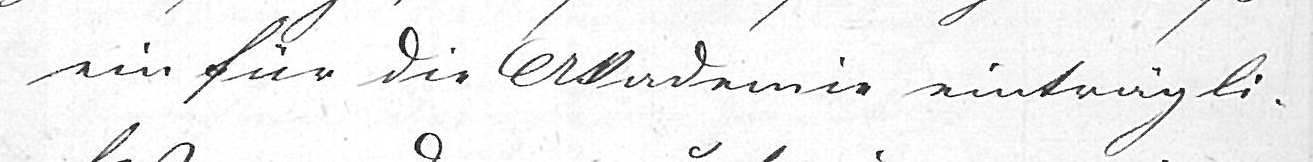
ein für die Akademie einträgli-
